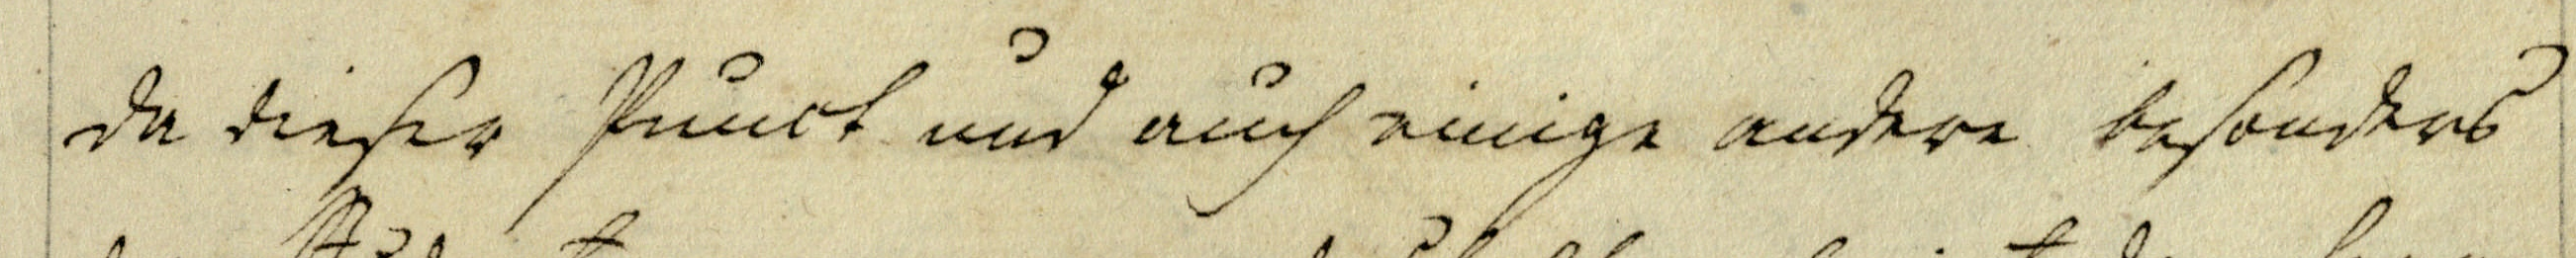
da dieser Punct und auch einige andere besonders
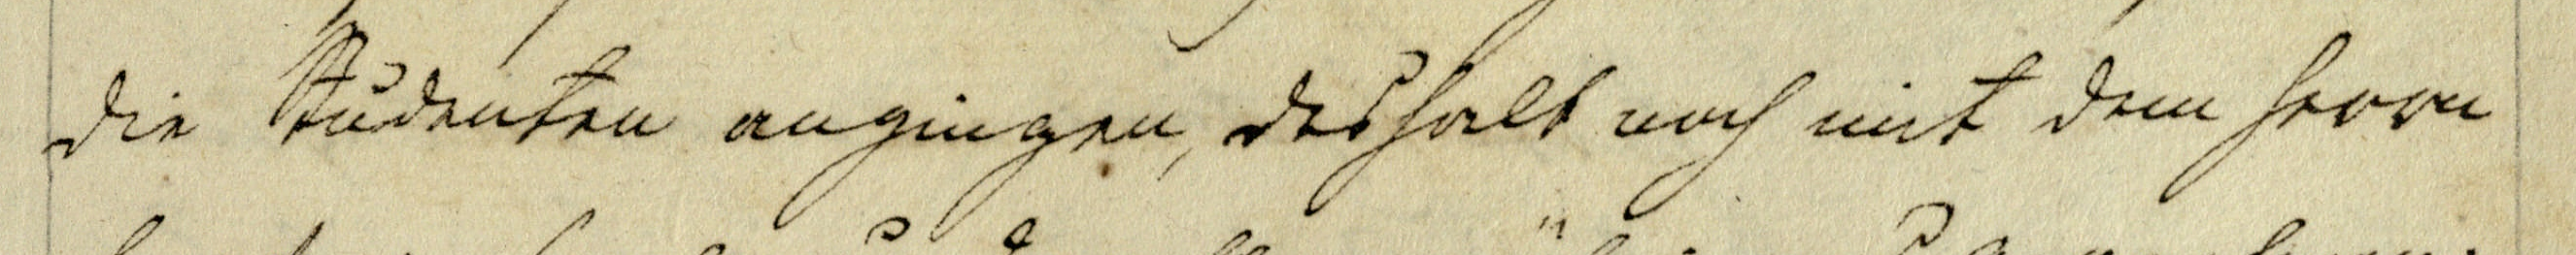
die Studenten angingen, deshalb noch mit dem Herrn
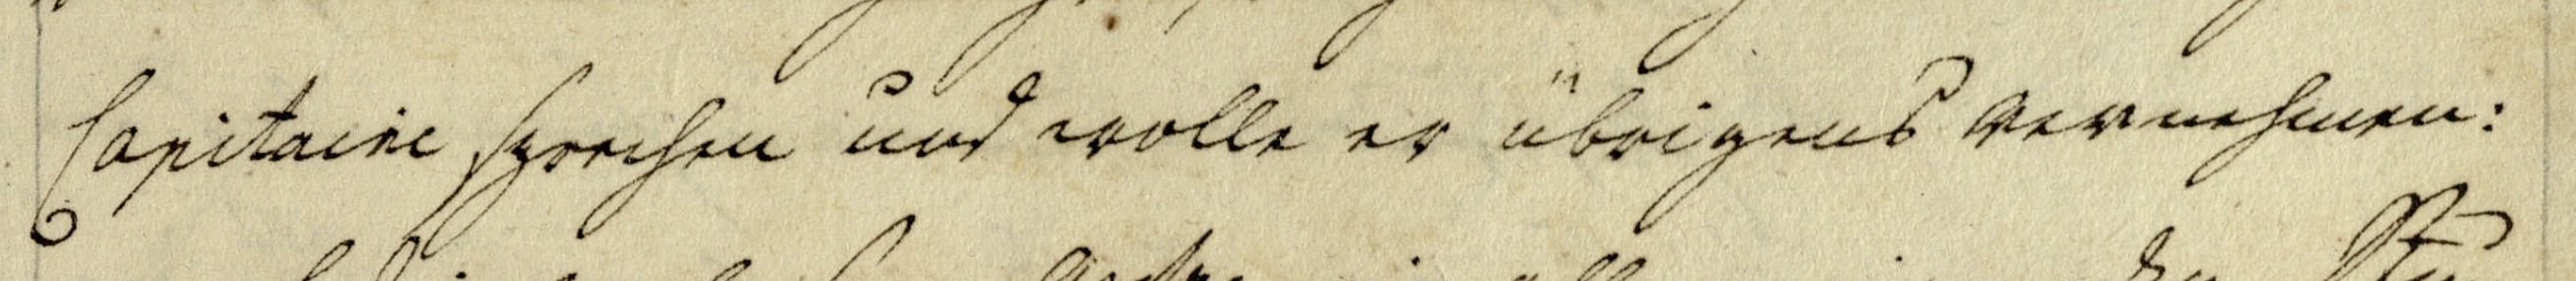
Capitaine sprechen und wolle er übrigens vernehmen:
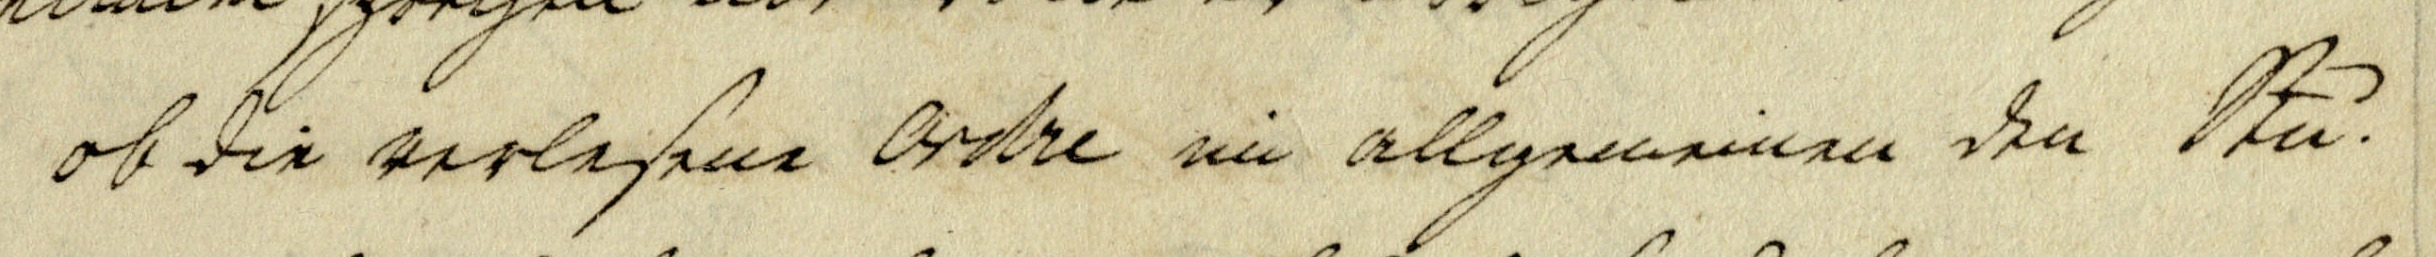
ob die verlesene Ordre im allgemeinen den Stu¬
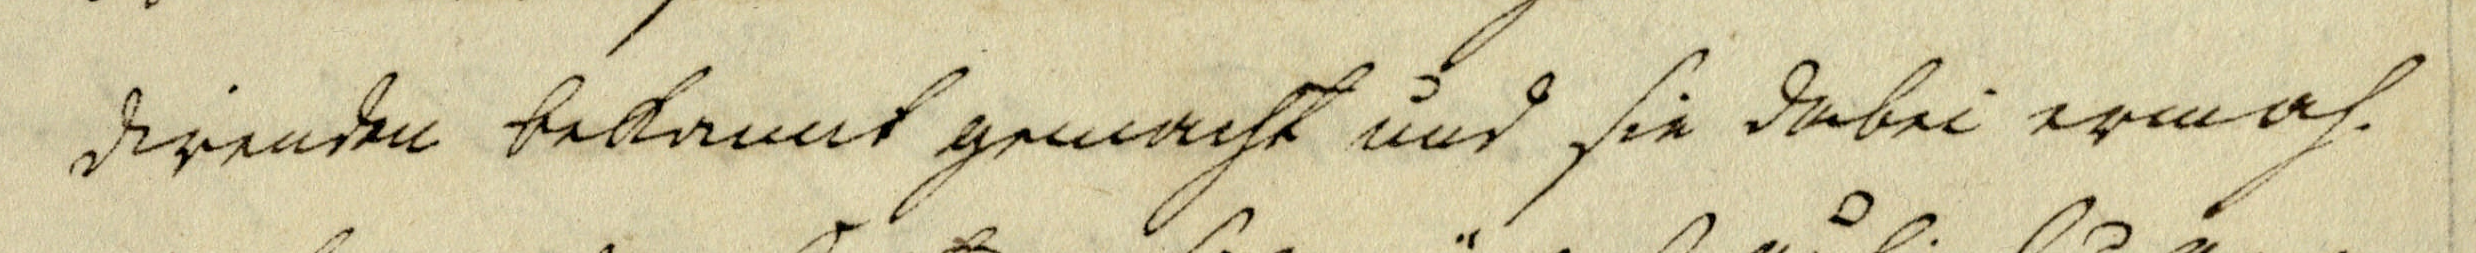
direnden bekannt gemacht und sie dabei ermah¬
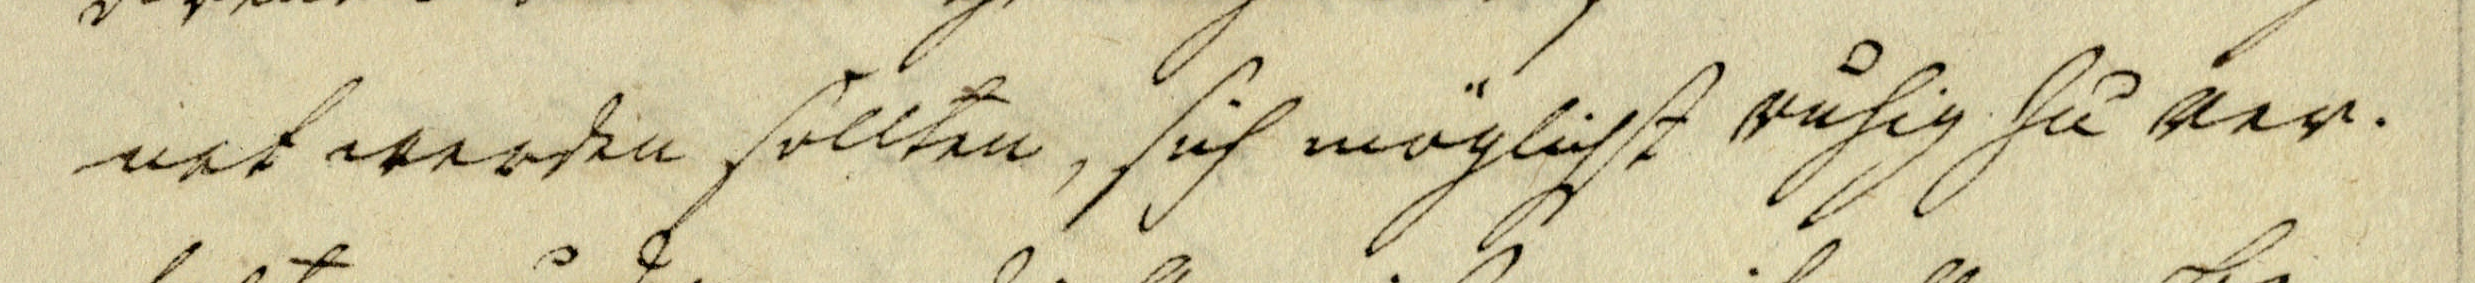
net werden sollten, sich möglichst ruhig zu ver¬
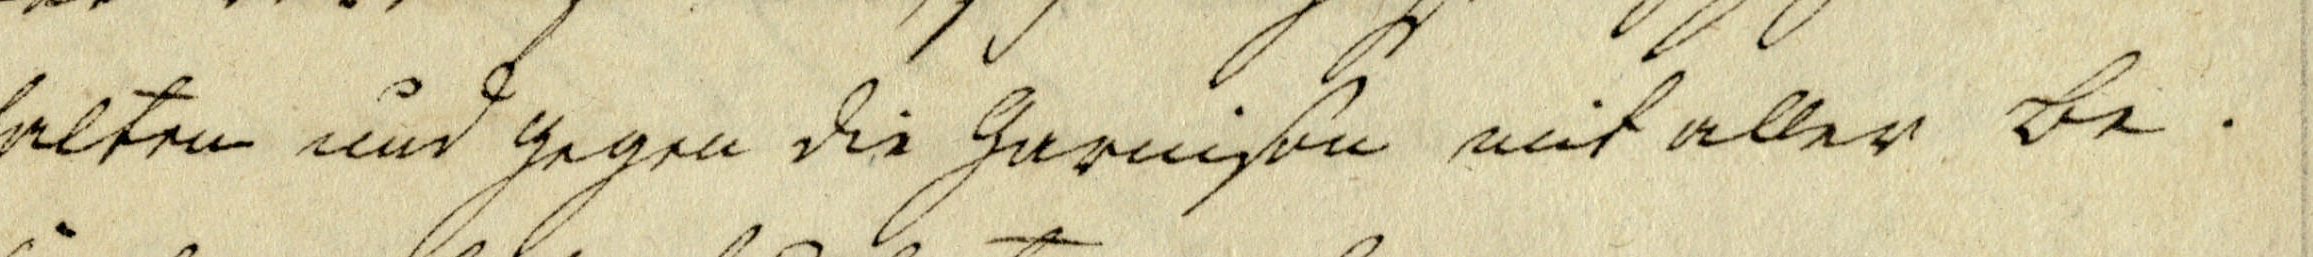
halten und gegen die Garnison mit aller Be¬
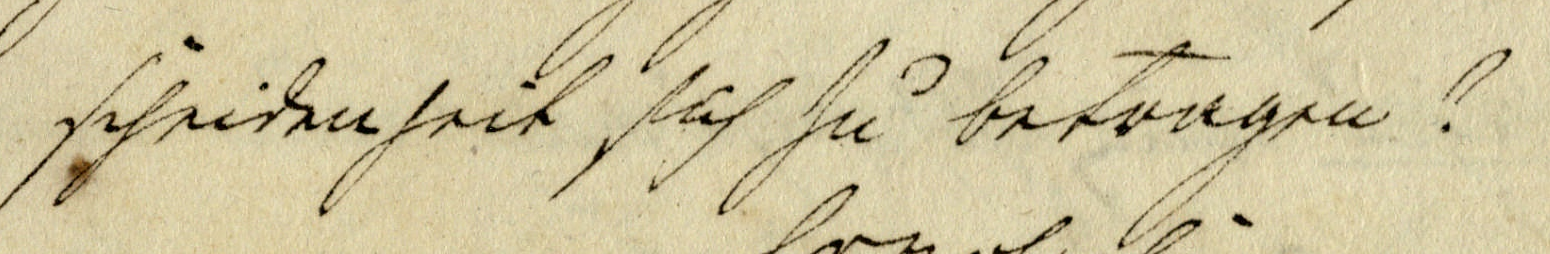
scheidenheit sich zu betragen?
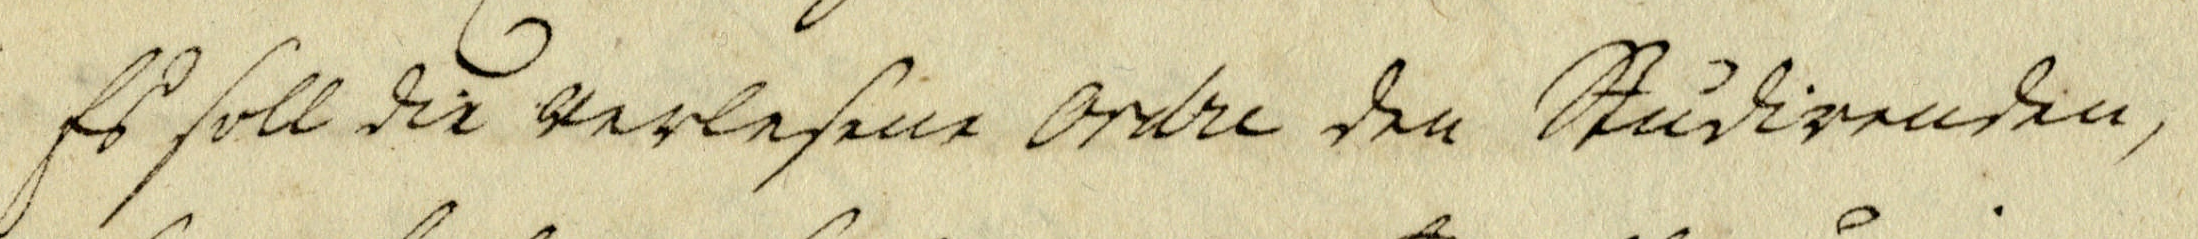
Es soll die verlesene Ordre den Studirenden,
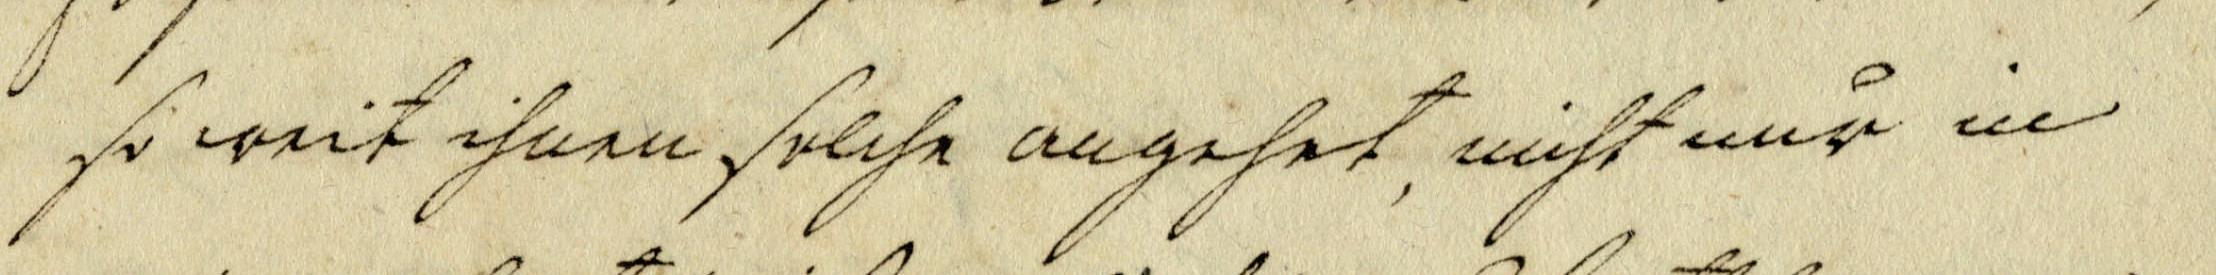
so weit ihnen solche angehet, nicht nur in
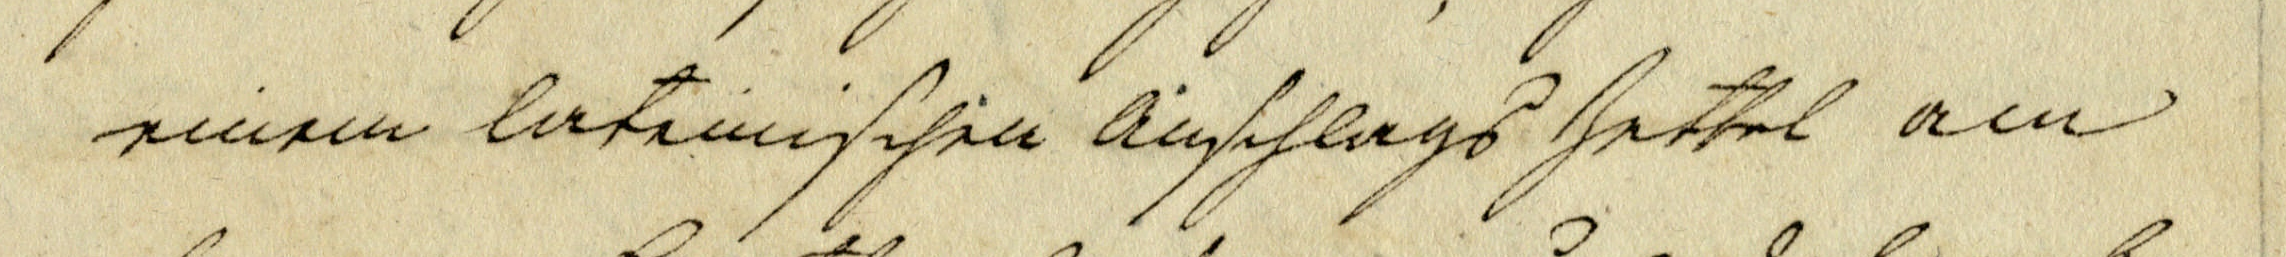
einem lateinischen Anschlags Zettel am
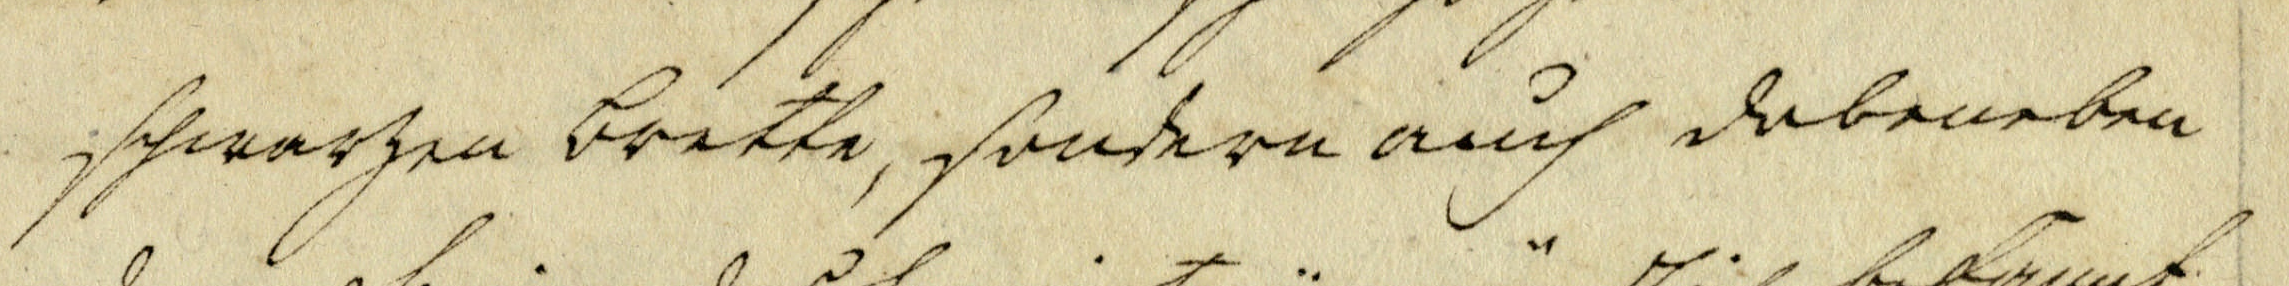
schwarzen Brette, sondern auch dabeneben
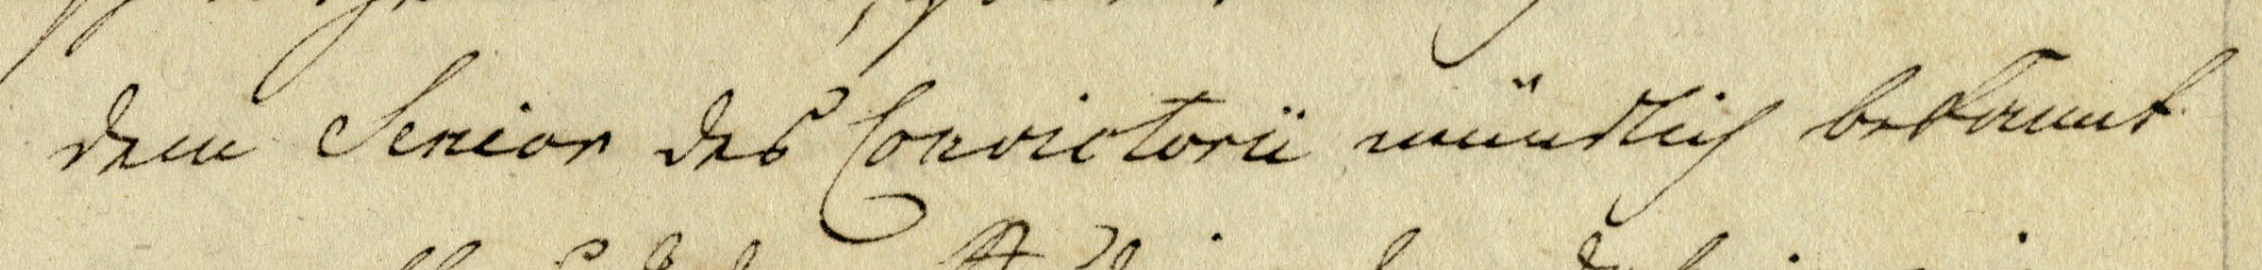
dem Senior des Convictorii mündlich bekannt
